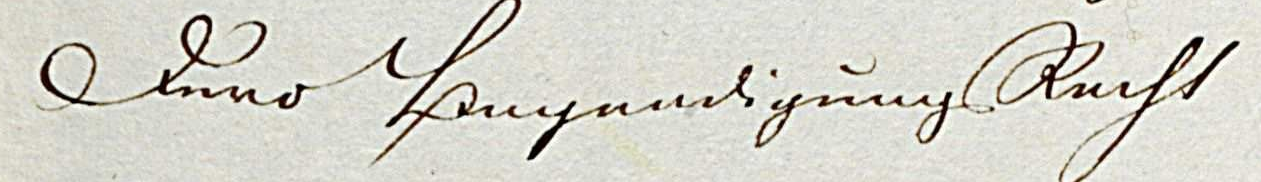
Dero Begnadigungs Recht
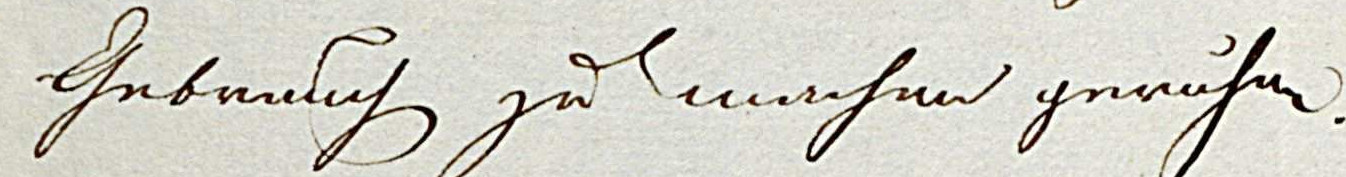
Gebrauch zu machen geruhen.
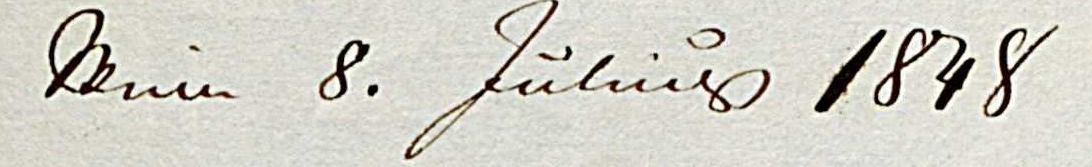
Wien 8. Julius 1848
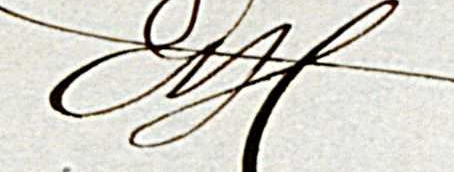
AhE
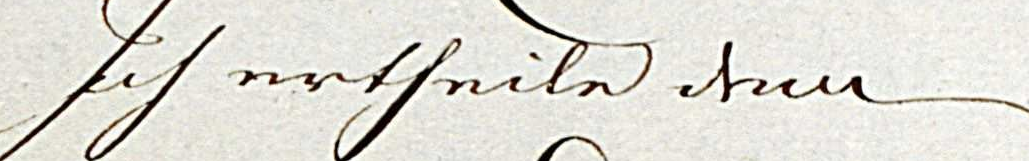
Ich ertheile dem
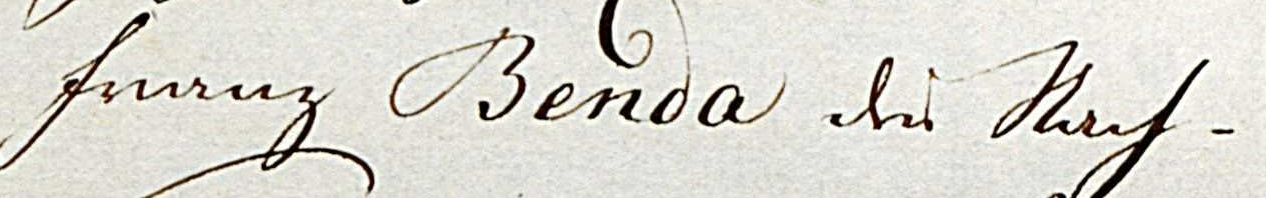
Franz Benda die Nach¬
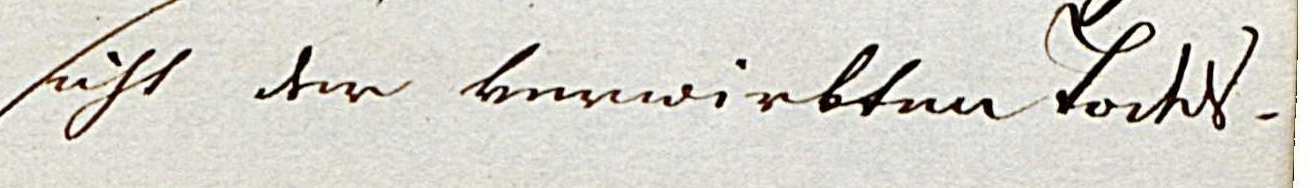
sicht der verwirkten Todes¬
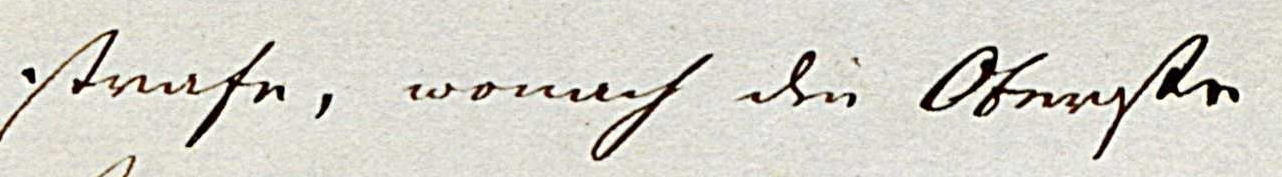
strafe, worauf die Oberste
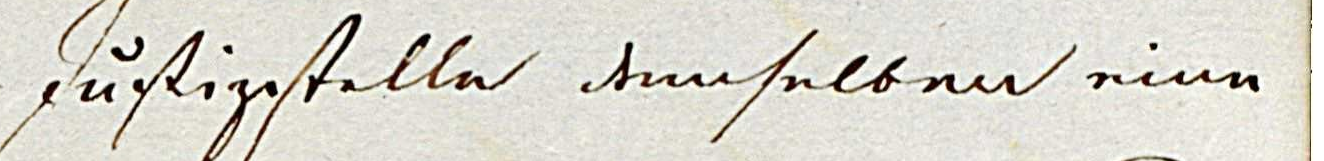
Justizstelle demselben eine
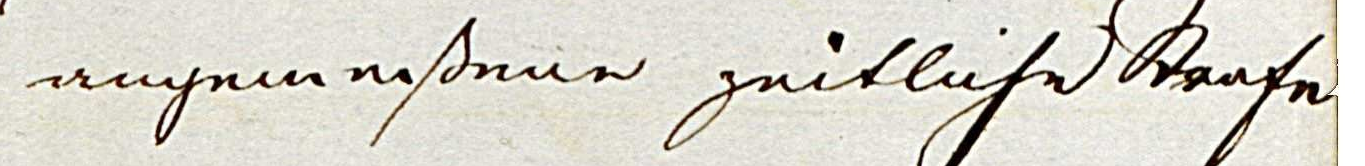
angemeßene zeitliche Strafe
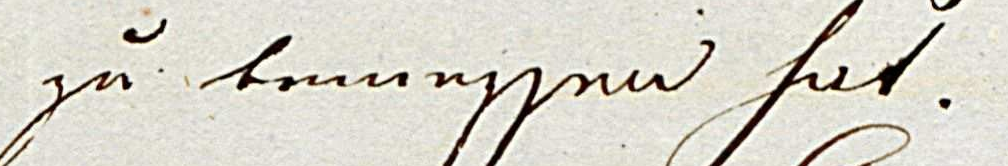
zu bemessen hat.
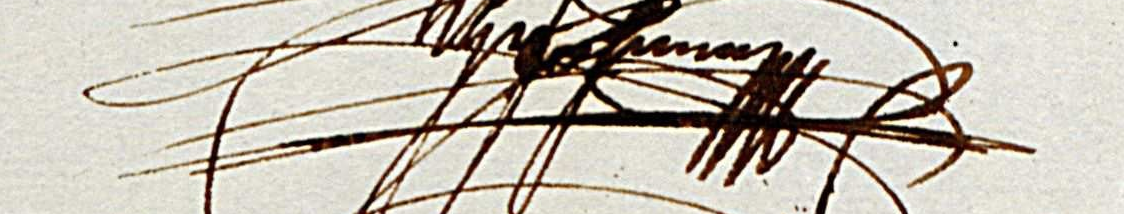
Erz. Johann
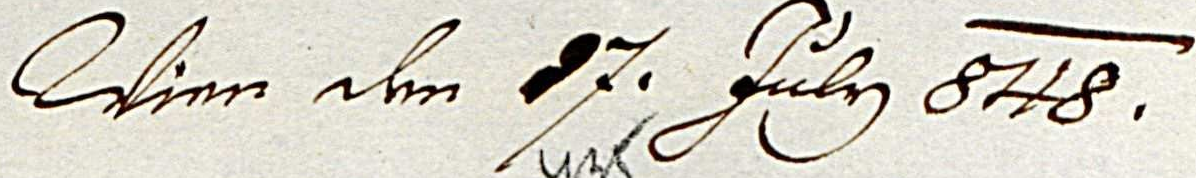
Wien, dem 7. July 1848
